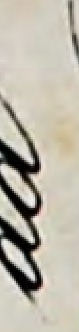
ad
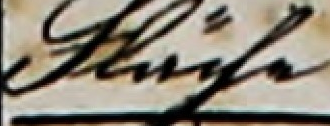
Fläche
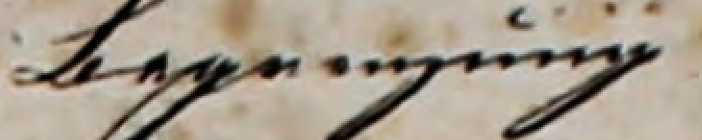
Begrenzung
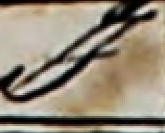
J.
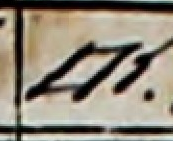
Ck.
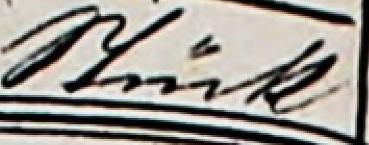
Stück
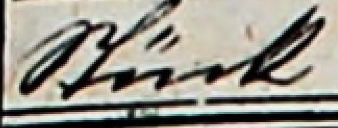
Stück
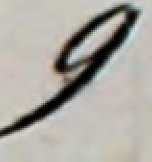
9
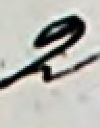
2
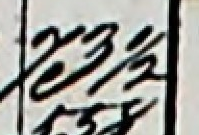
73 ½
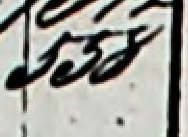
558
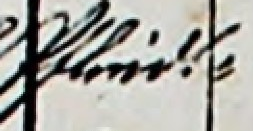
Pflinds„
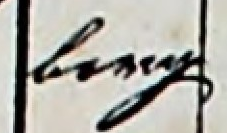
berg
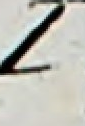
I
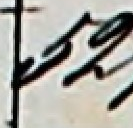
52
